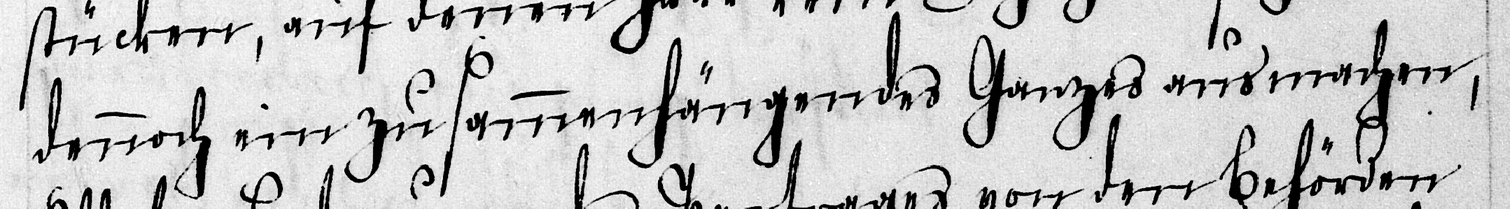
dennoch ein zusammenhängendes Ganzes ausmachen,
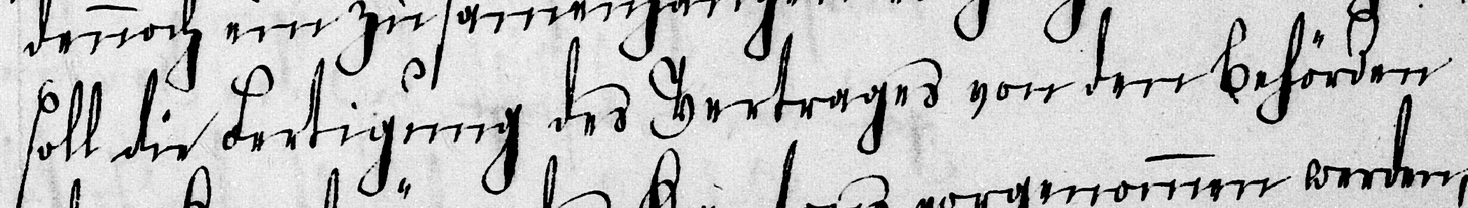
soll die Fertigung des Vertrages von den Behörden
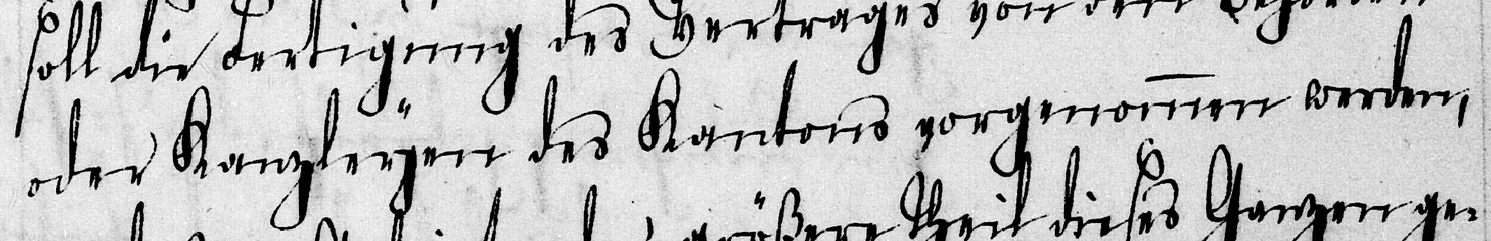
oder Kanzleyen des Kantons vorgenommen werden,
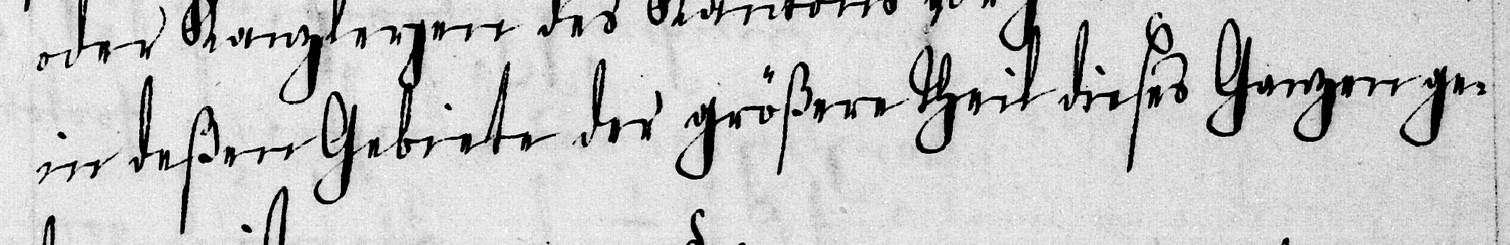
in deßen Gebiete der größere Theil dieses Ganzen ge¬
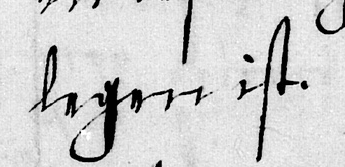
legen ist.
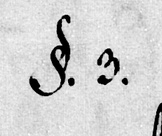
§. 3.
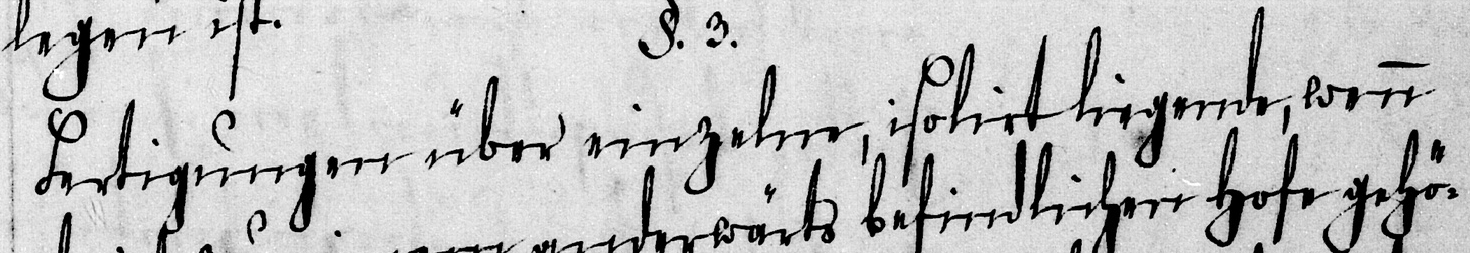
Fertigungen über einzelne, isolirt liegende, wenn
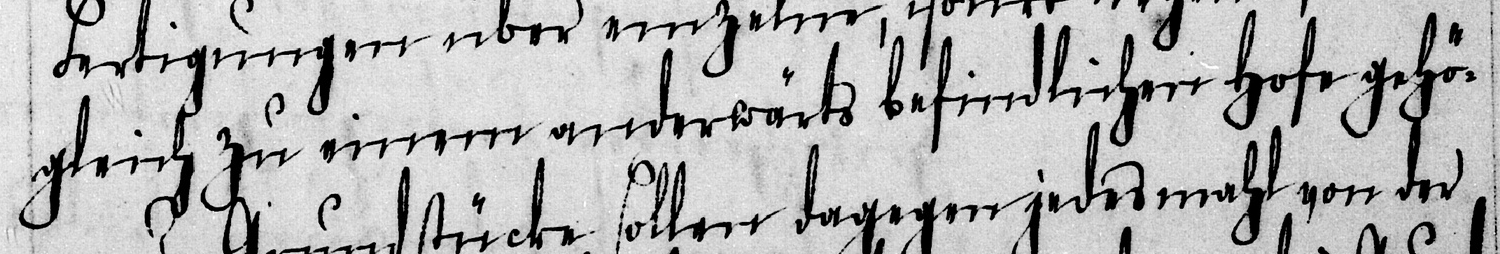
gleich zu einem anderwärts befindlichen Hofe gehö¬
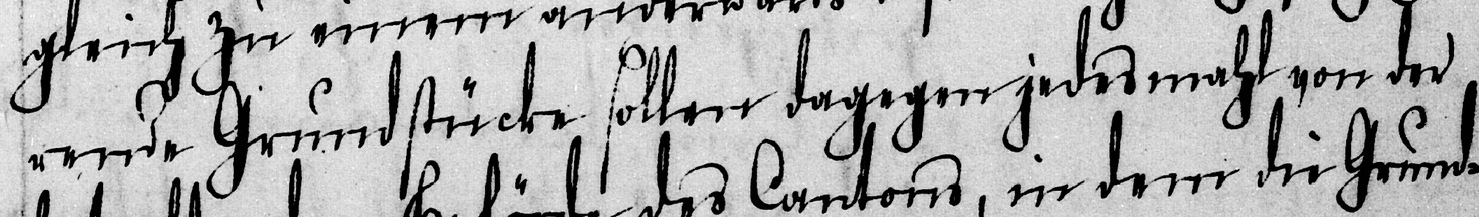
rende Grundstücke sollen dagegen jedesmahl von der
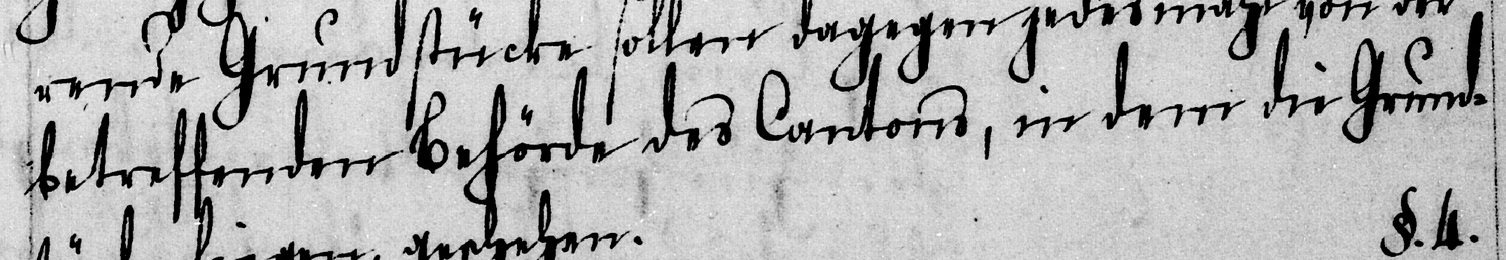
betreffenden Behörde des Cantons, in dem die Grund¬
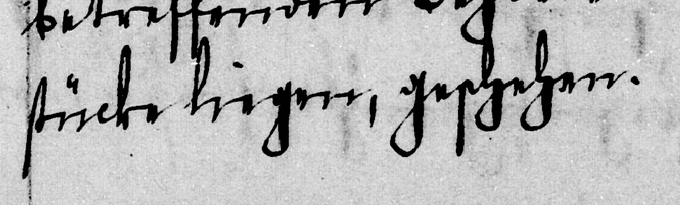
stücke liegen, geschehen.
